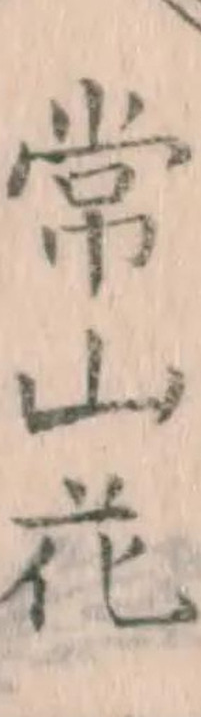常山花
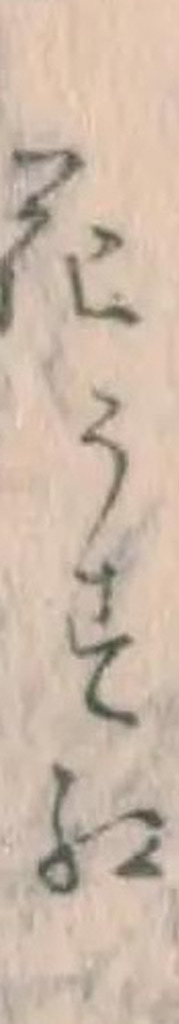花うす紅
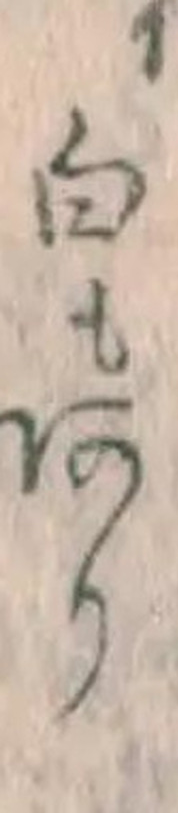白もあり
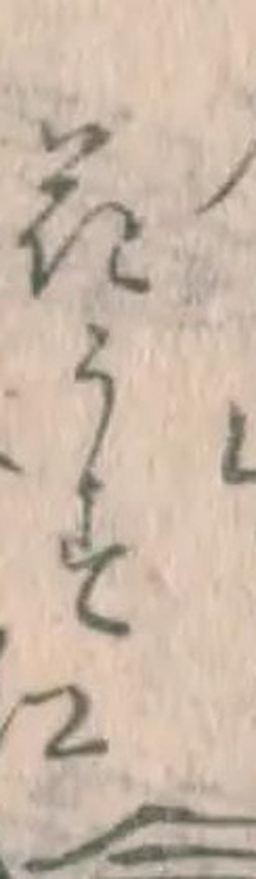花うす紅
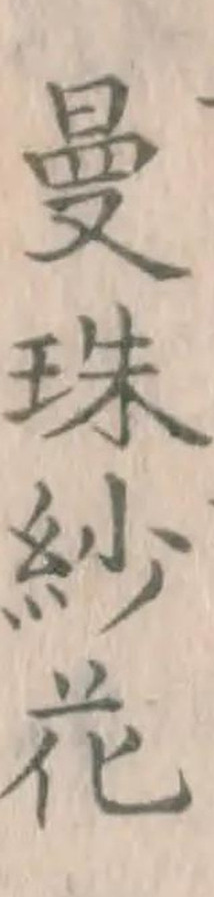曼珠紗花
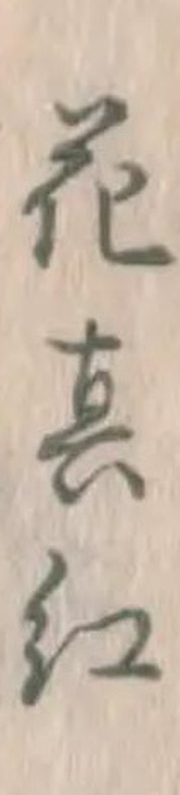花真紅

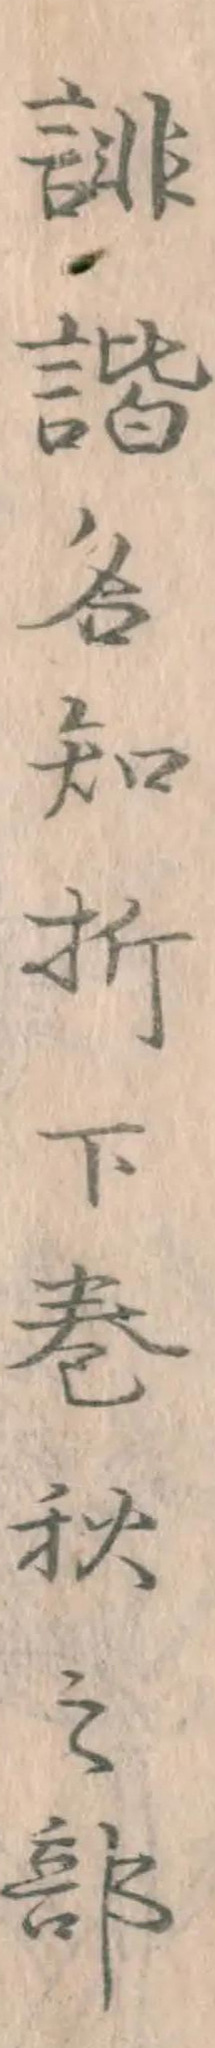俳諧名知折下巻秋之部
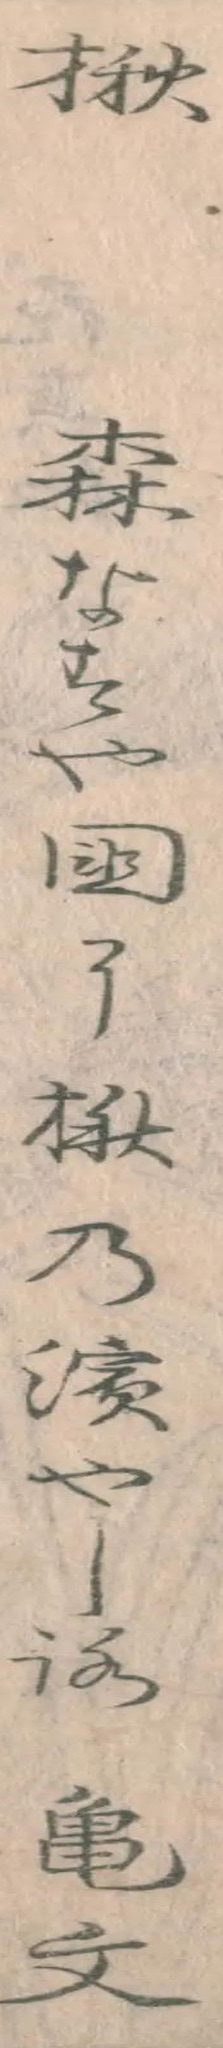楸森なすや国に楸の浜やしろ亀文
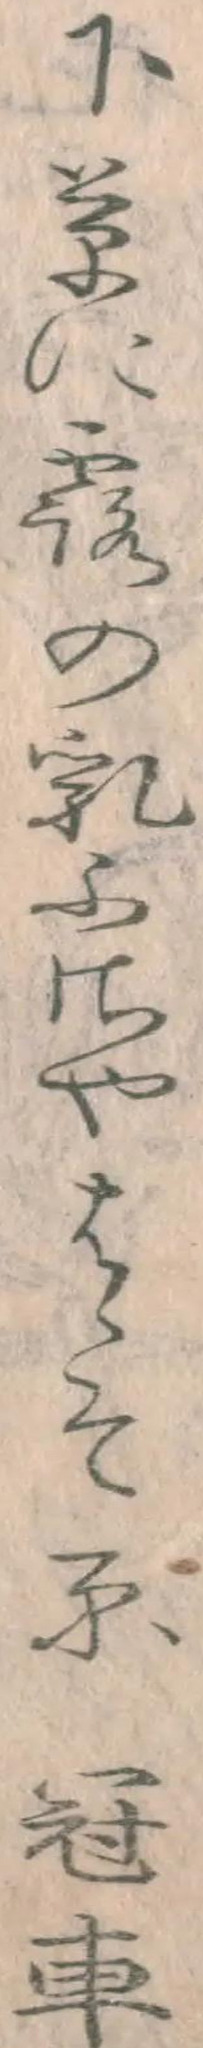柞下草に露の乳ふさやはゝそ草冠車
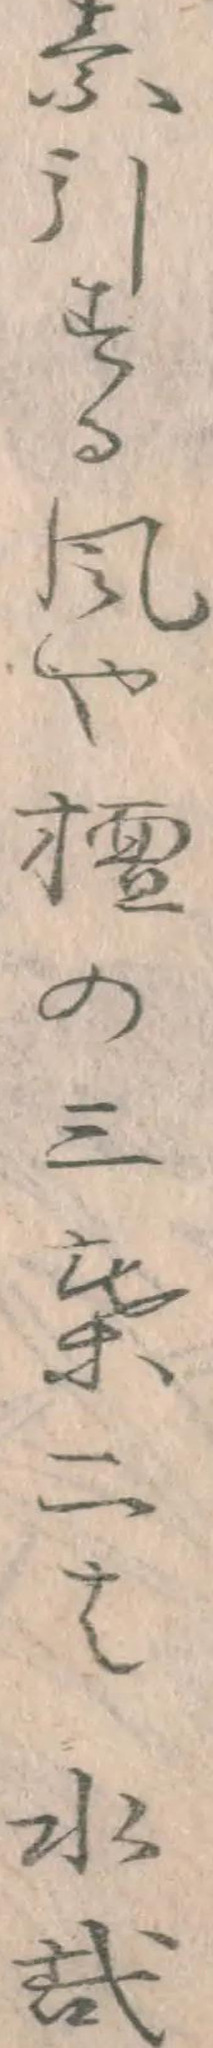檀な引する風や檀の三葉には水哉
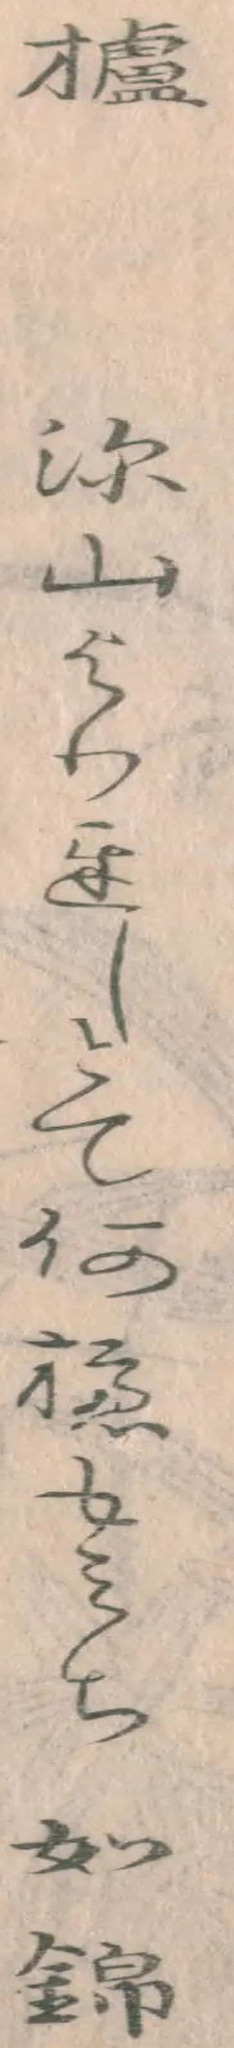櫨深山より遅しとて何櫨もみち如錦
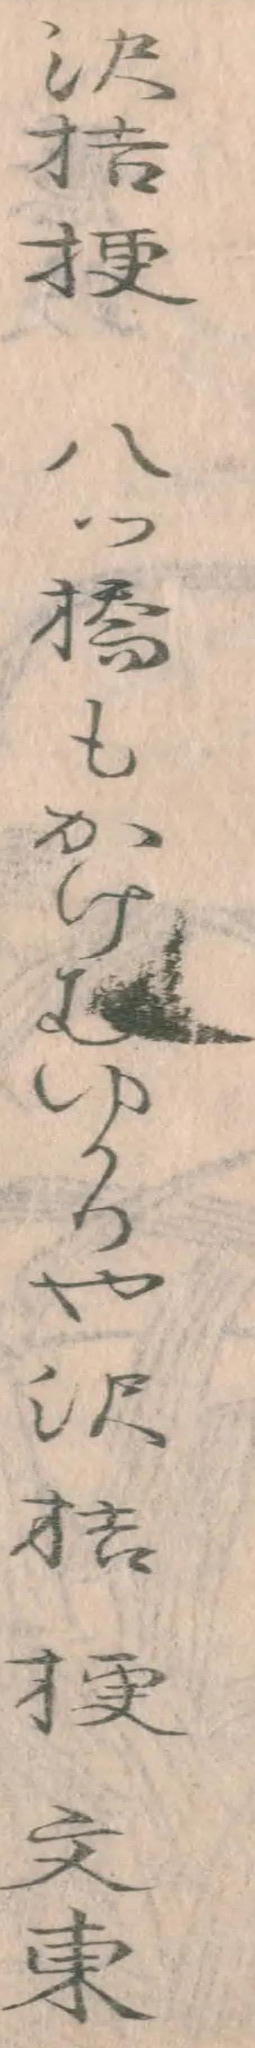沢桔梗八ツ橋もかけむゆかりや沢桔梗文東
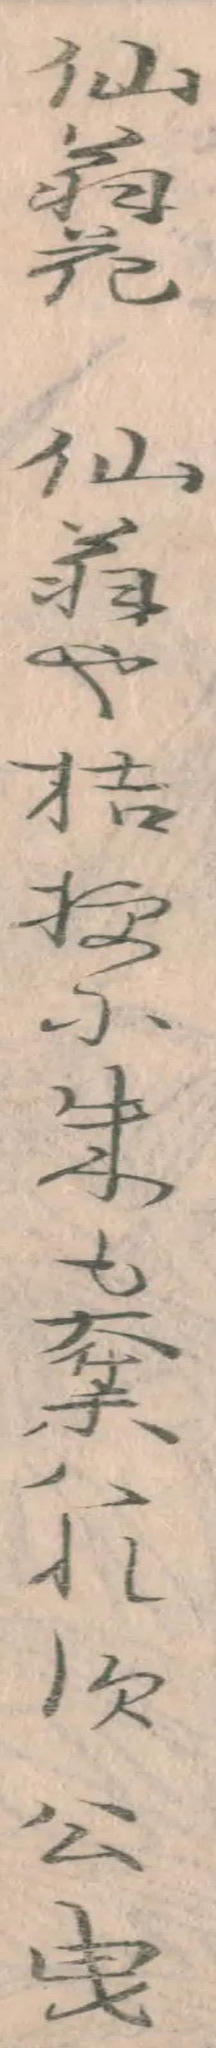仙翁花仙翁や桔梗に朱も奪はれす公曳
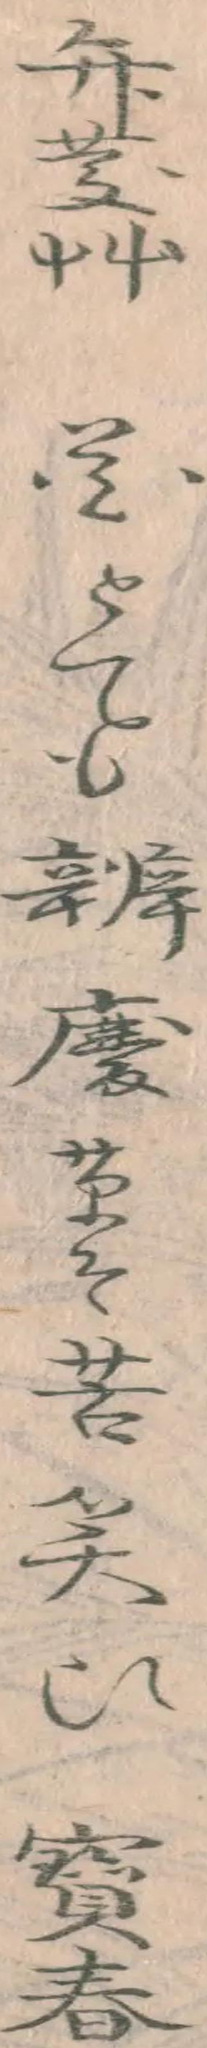弁慶草花とても弁慶草そ苦笑ひ寶春
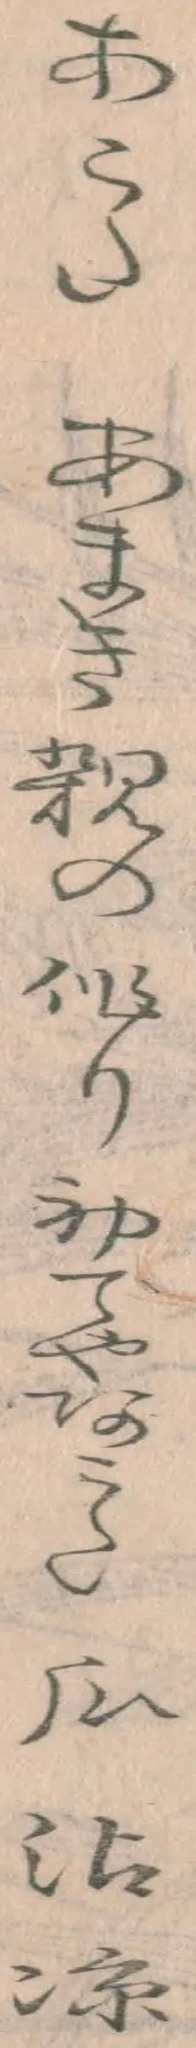あこたあまき親の作り初てやあこた瓜沾凉
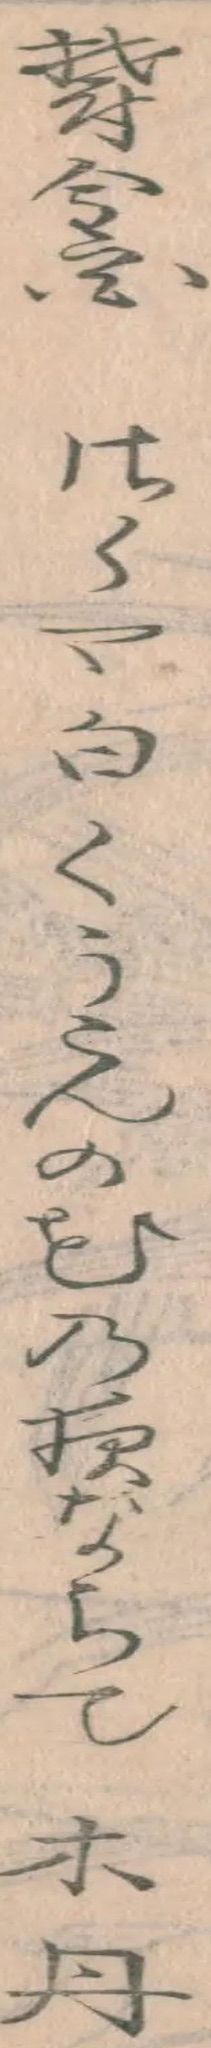鬱金花さくや白くうこんの花の夜ならて木丹
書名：誹諧名知折 2巻. [2]
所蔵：国立国会図書館 National Diet Library, JAPAN
